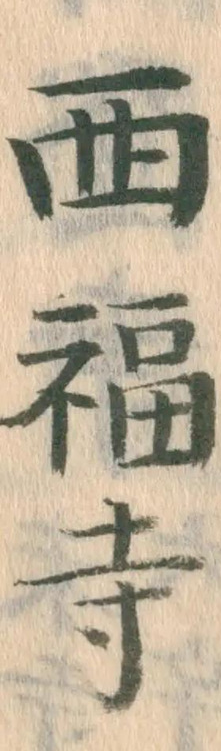西福寺
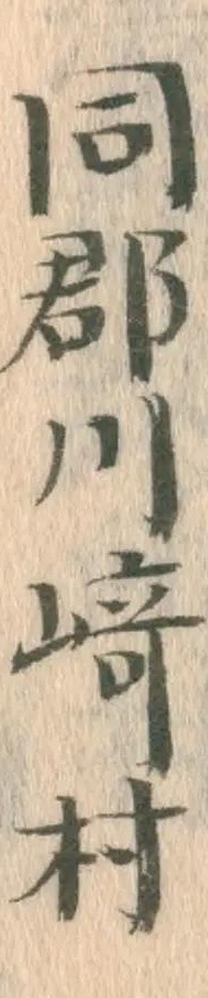同郡川崎村
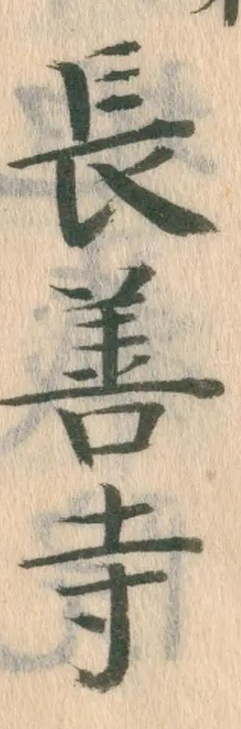長善寺
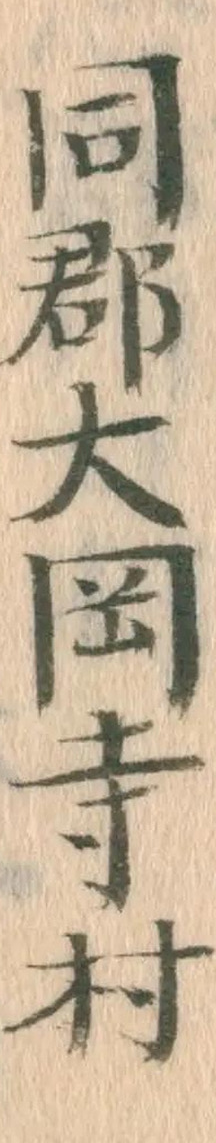同郡大岡寺村
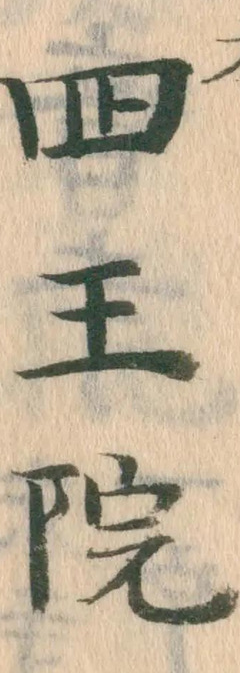四王院
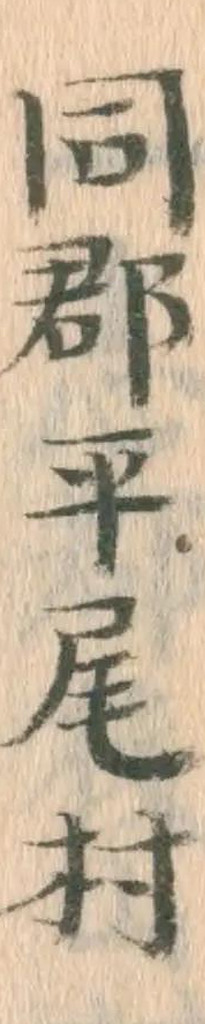同郡平尾村
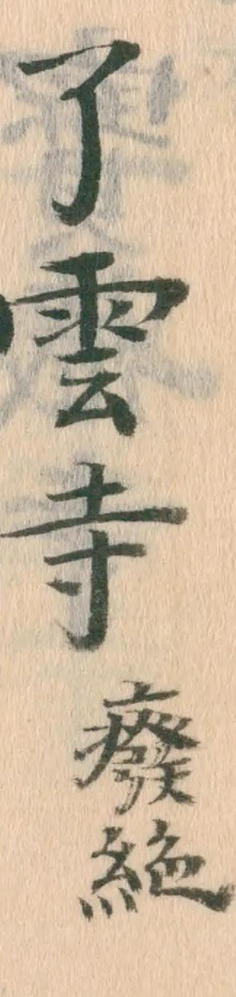了雲寺廃絶
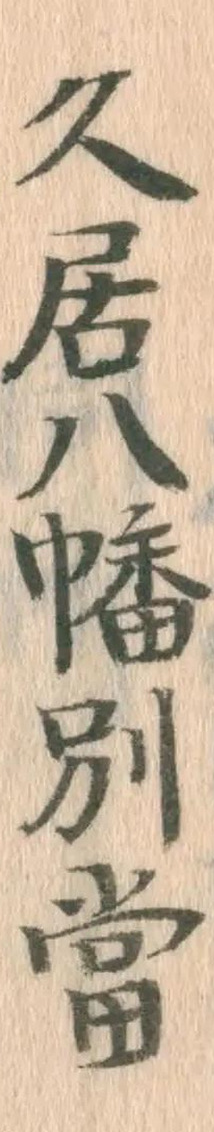久居八幡別当
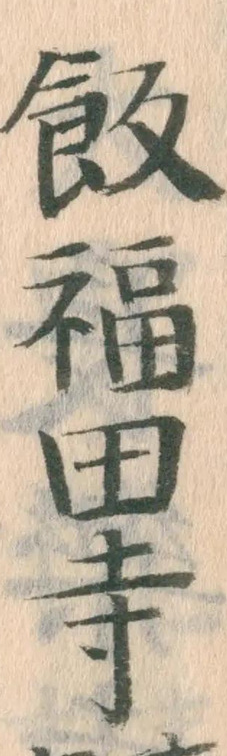飯福田寺
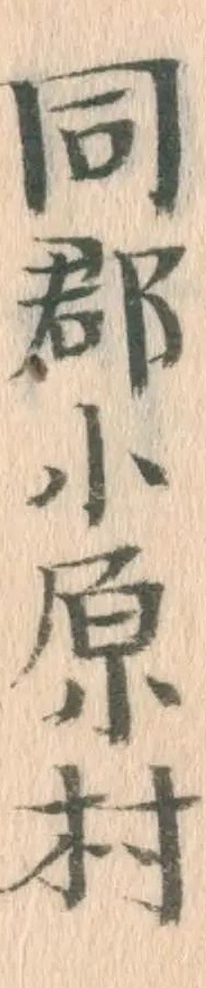同郡小原村
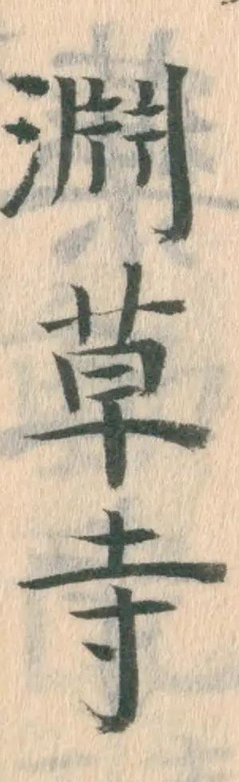湖草寺

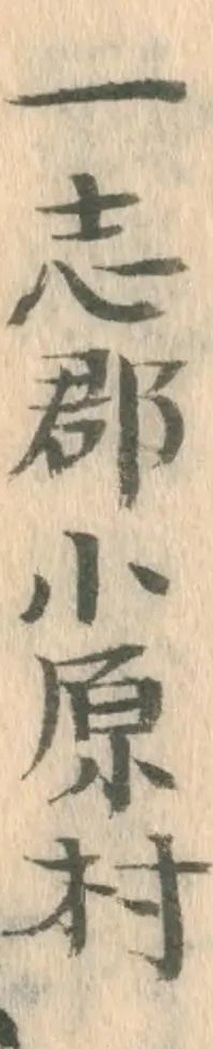一志郡小原村
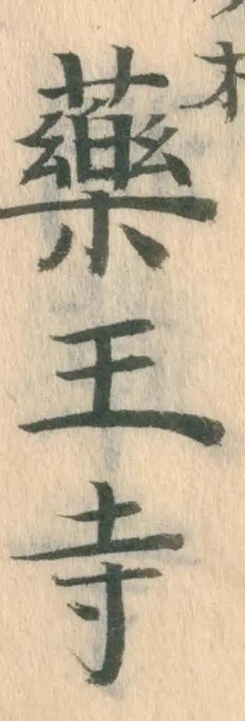薬王寺
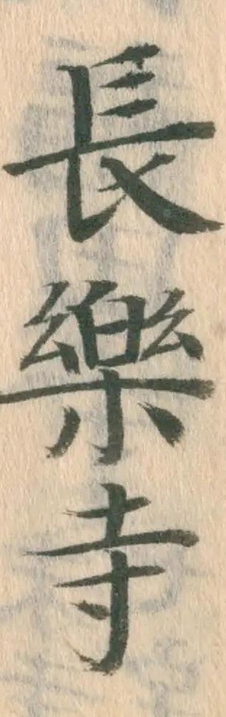長楽寺
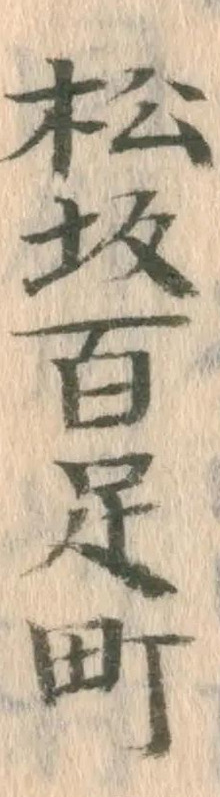松坂百足町
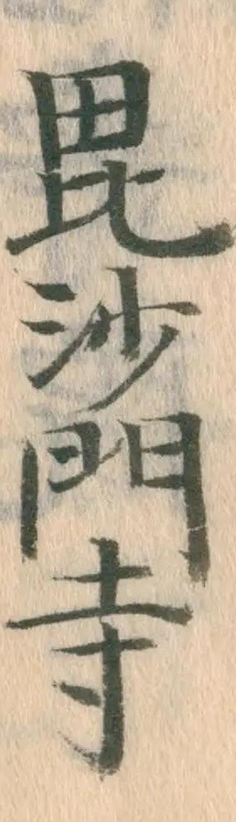毘沙門寺
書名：古義真言宗本末帳 21巻. [4] 第三 伊賀国、伊勢国、志摩国、尾張国、三河国、遠江国、駿河国、伊豆国、甲斐国
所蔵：国立国会図書館 National Diet Library, JAPAN
